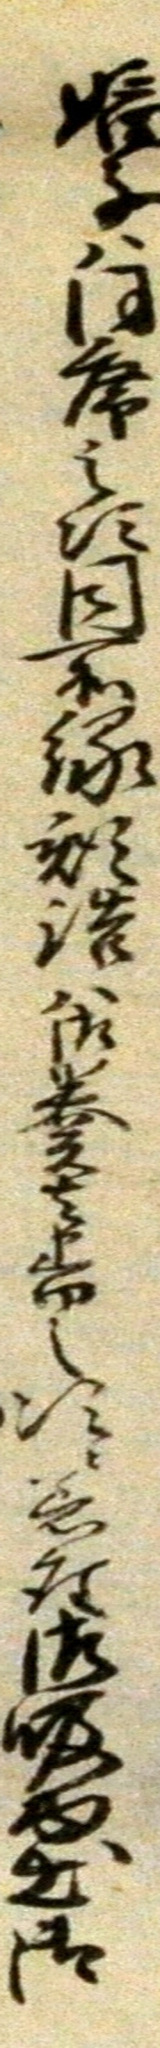嫡子ハ同席之次同所縁頬詰ハ御奏者番之次ニ着座御吸物出御
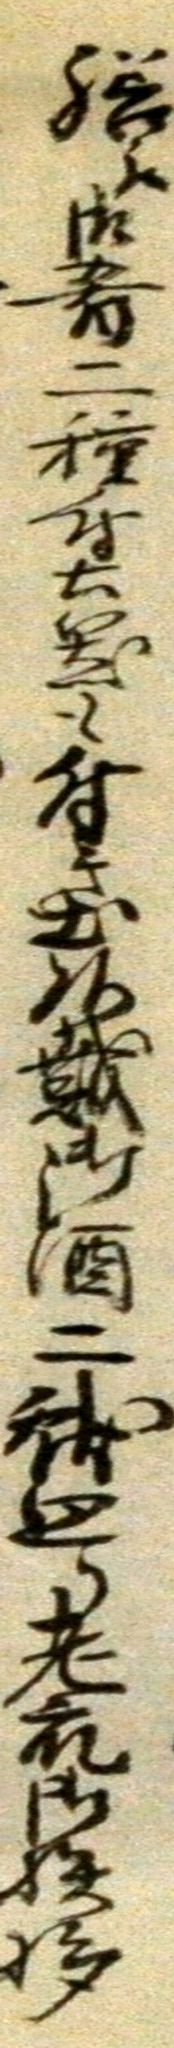膳え御肴二種付土器も付キ出頂戴御酒二献廻り老衆御挨拶
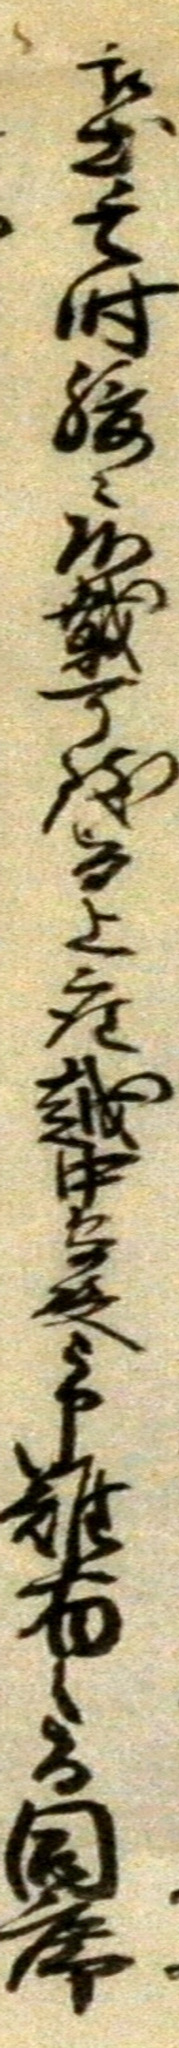被出其時緩々頂戴可致旨上座越中守殿被申難有之旨同席
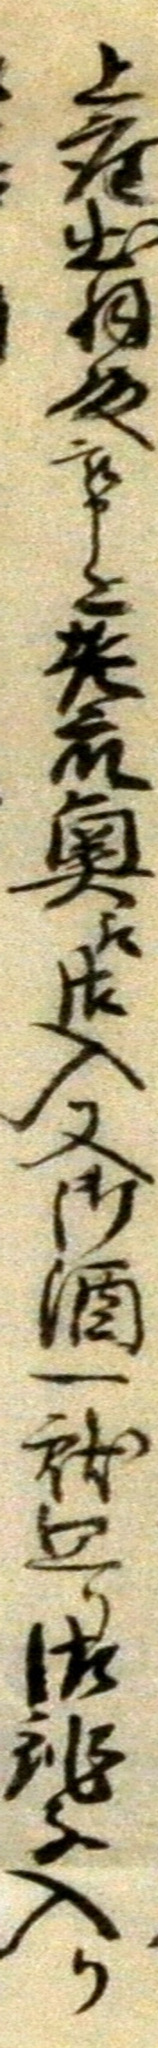上座出羽殿被申上老衆奥え御入又御酒一献廻り御銚子入り
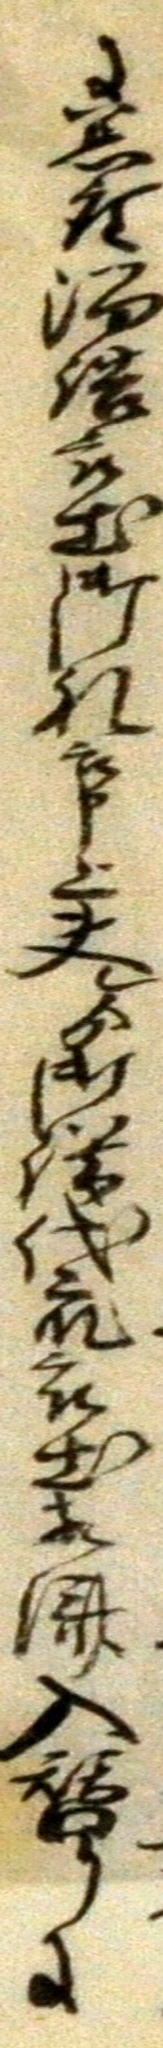に着座溜詰被出御礼被申上夫レゟ御譜代衆被出相済入替りに
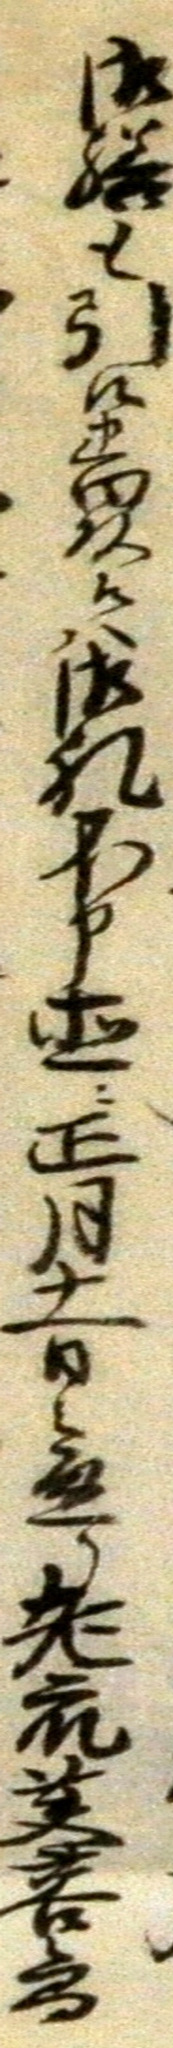御膳も引候番頭えハ御礼不申直ニ正月十一日之通り老衆芙蓉之間
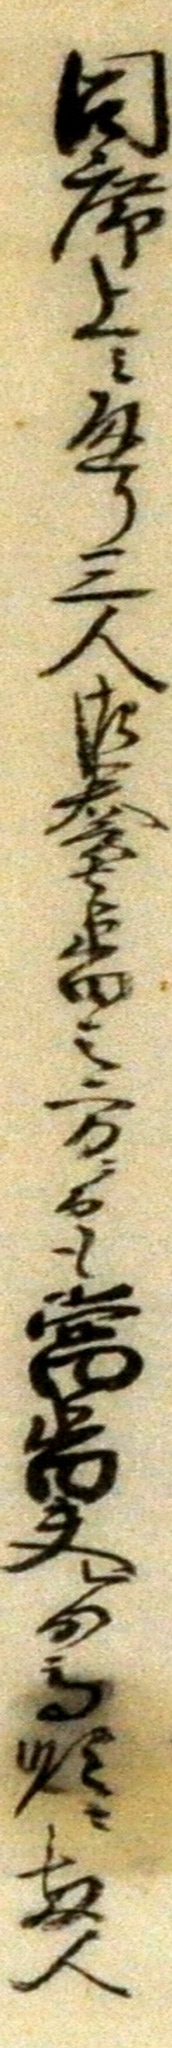同席上ミ通り三人御奏者番之方ニ而も当番夫レゟ高順ニ両人
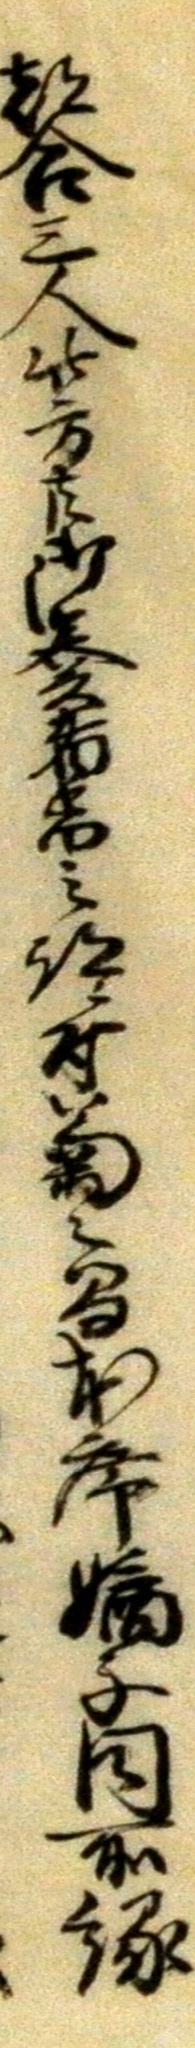都合三人此方共御奏者番之跡ニ付菊之間本席嫡子同所縁
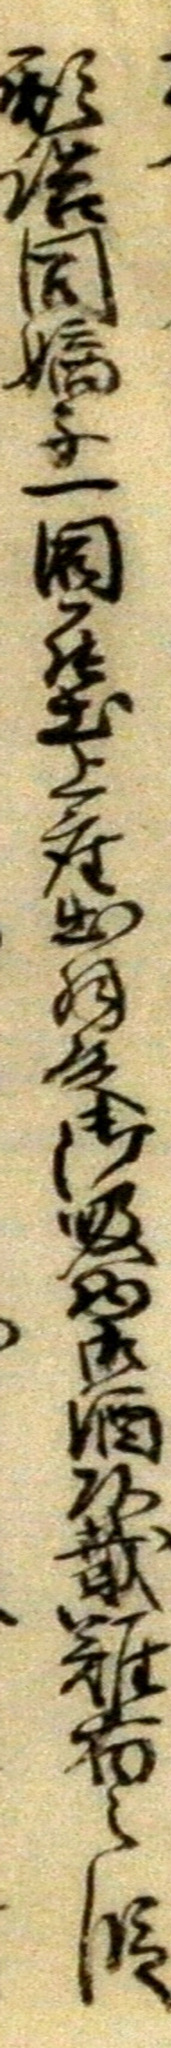頬詰同嫡子一同罷出上座出羽殿御吸物御酒頂戴難有之段
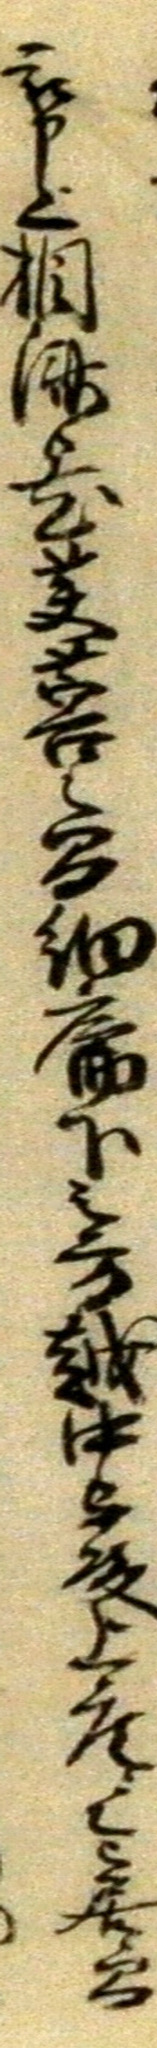被申上相済候尤芙蓉之間細廊下之方越中守殿上座ニて被居候間
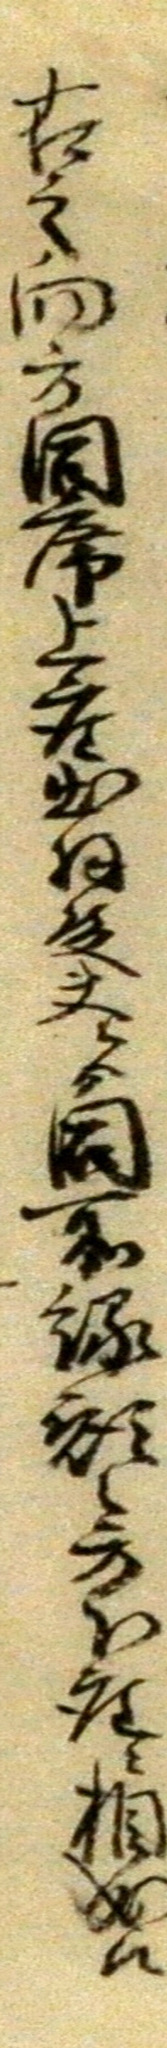右之向方同席上座出羽殿夫レゟ同所縁頬之方下座ニ相成候
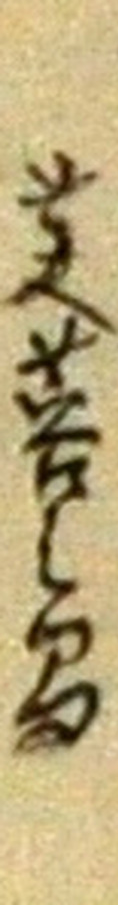芙蓉之間

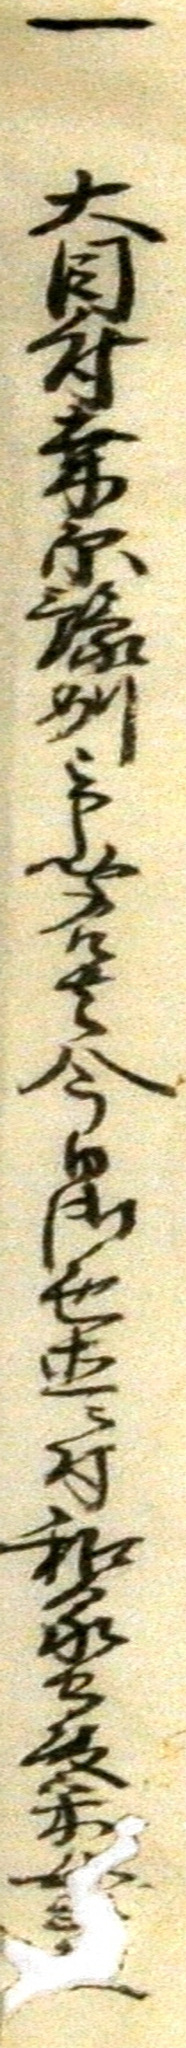一大目付桑原豫州被申聞候は今日御色直ニ付和泉守殿采女正殿
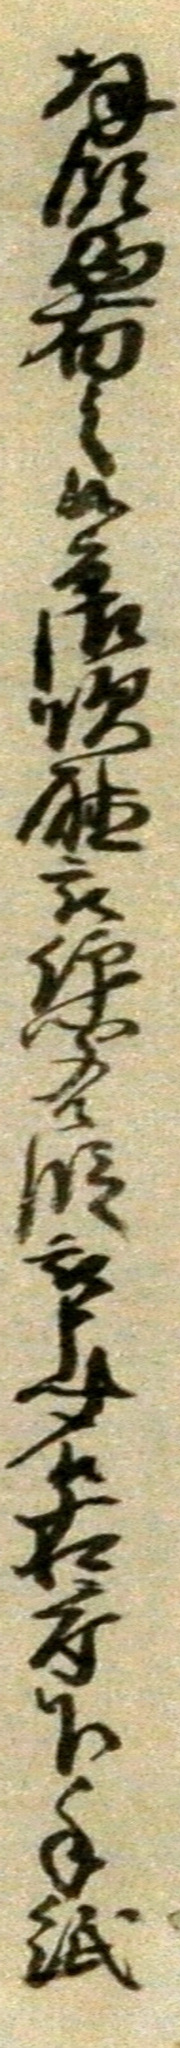拝領物有之候旨御吹聴被仰聞候段被申聞候右ニ付下手紙
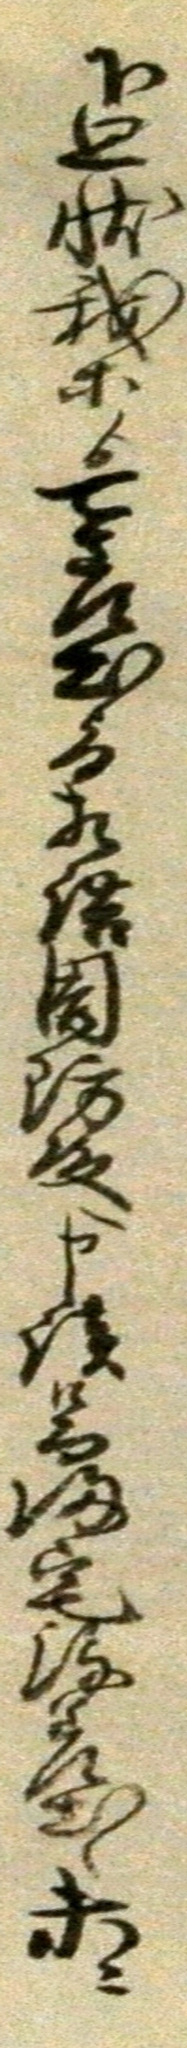下廻状我等ゟ可差出旨相詰周防殿へ申談候而帰宅後差出候末ニ
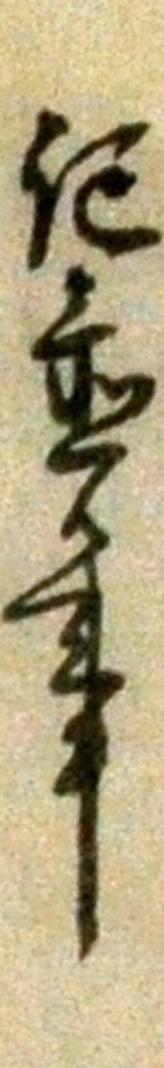記置候事
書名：若君様御色直御祝儀ノ節ノ留
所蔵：伊那市立高遠町図書館・合同会社AMANE
